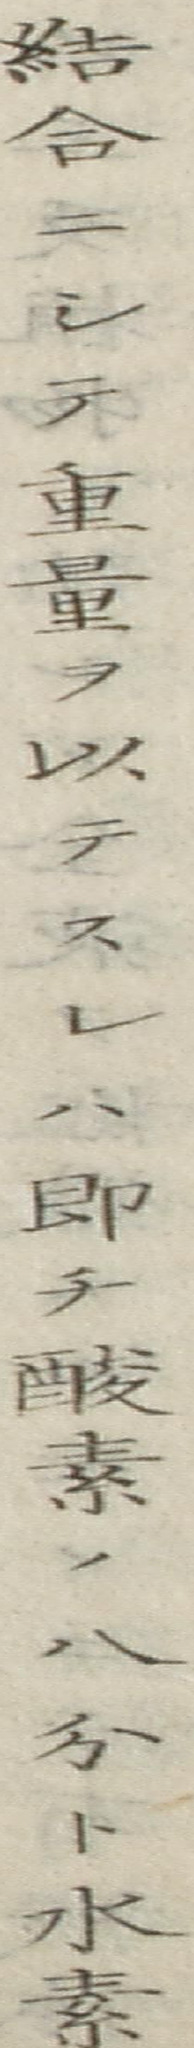結合ニシテ重量ヲ以テスレハ即チ酸素ノ八分ト水素
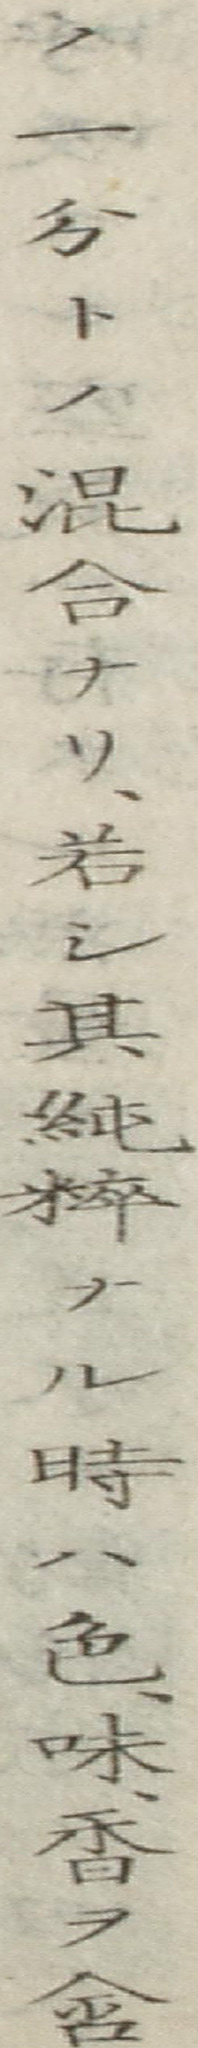ノ一分トノ混合ナリ、若シ其純粋ナル時ハ色、味、香ヲ含
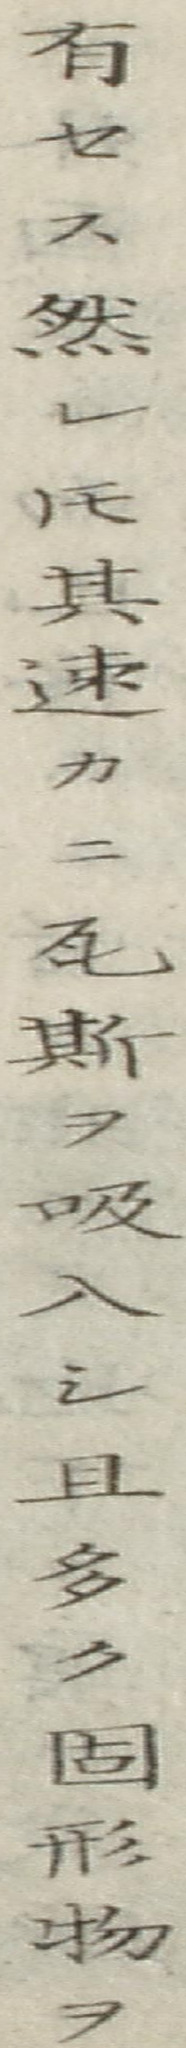有セス然レトモ其速カニ瓦斯ヲ吸入シ且多ク固形物ヲ
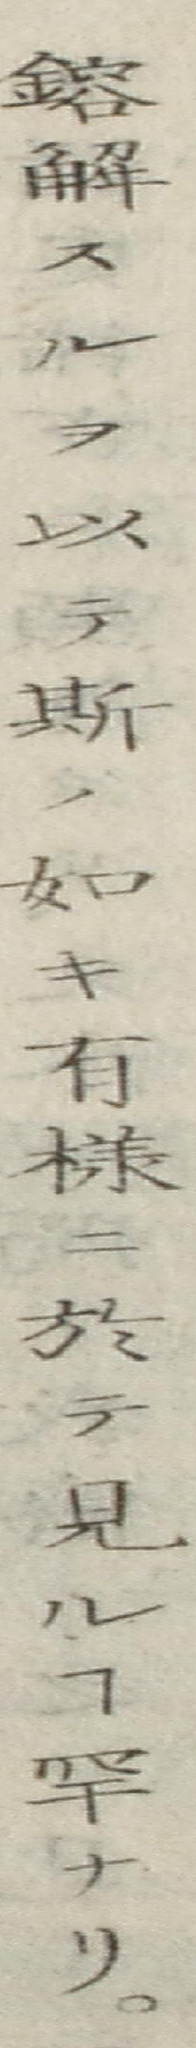溶解スルヲ以テ斯ノ如キ有様ニ於テ見ルコト罕ナリ。
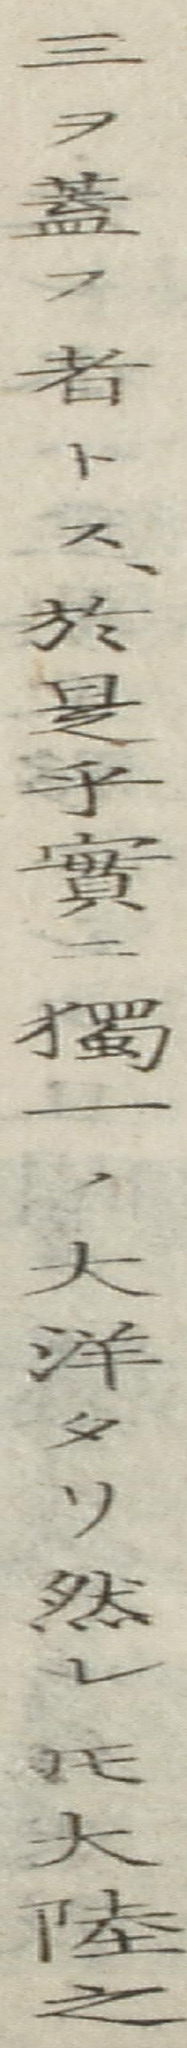三ヲ蓋フ者トス、於是乎実に獨一ノ大洋タリ然レトモ大陸之
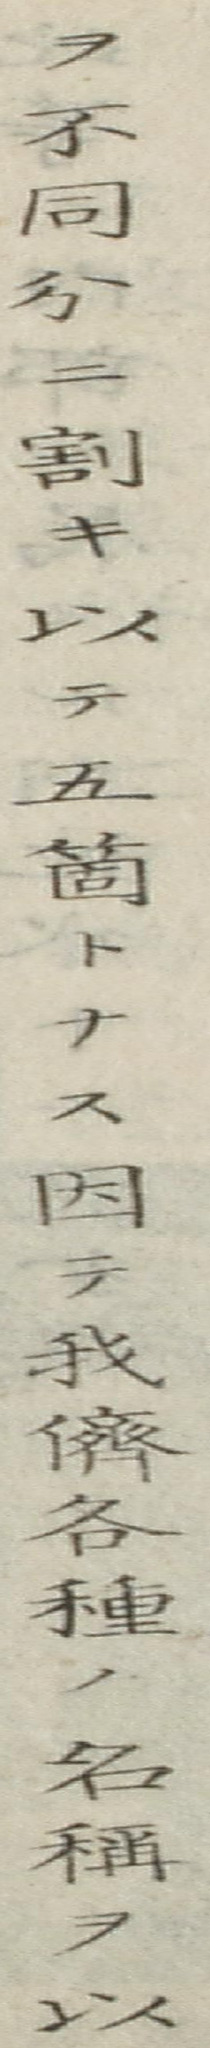ヲ不同分同分二割キ以テ五箇トナス因テ我儕各種ノ名稱ヲ以
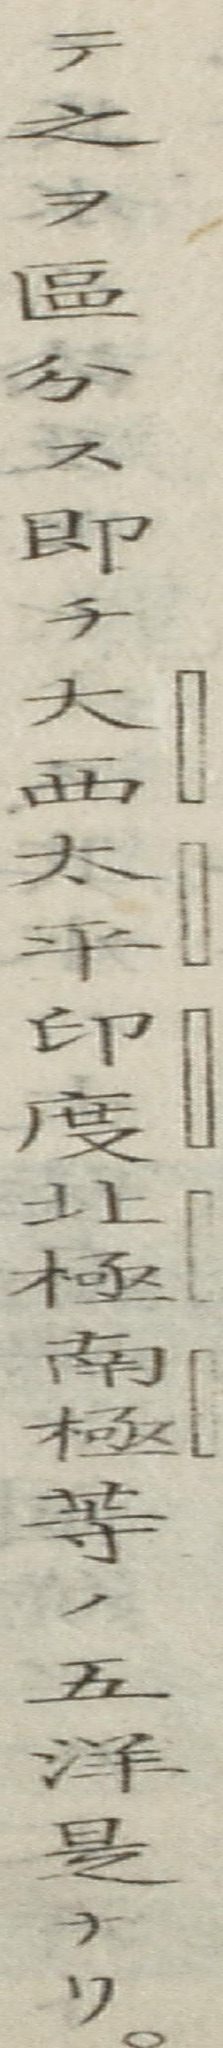テ之ヲ区分ス即チ大西太平印度北極南極等ノ五洋是ナリ。
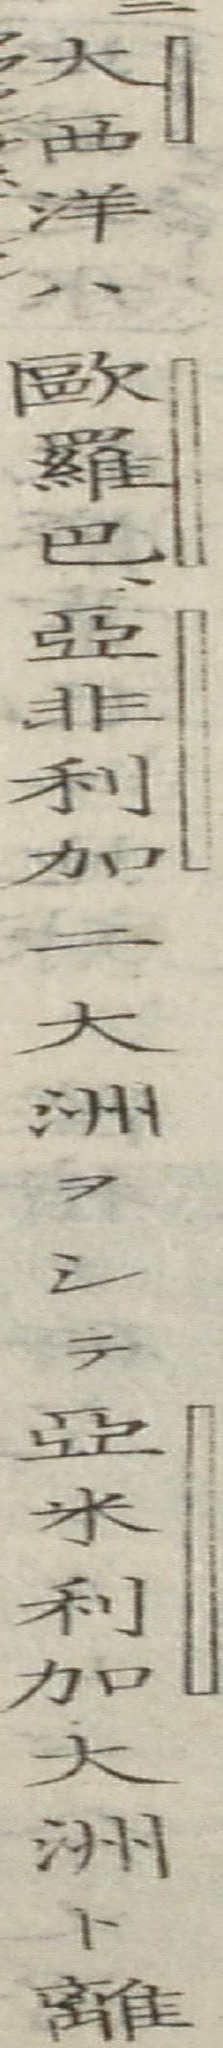三大西洋ハ欧羅巴、亜非利加ニ大洲ヲシテ亜米利加大洲ト離
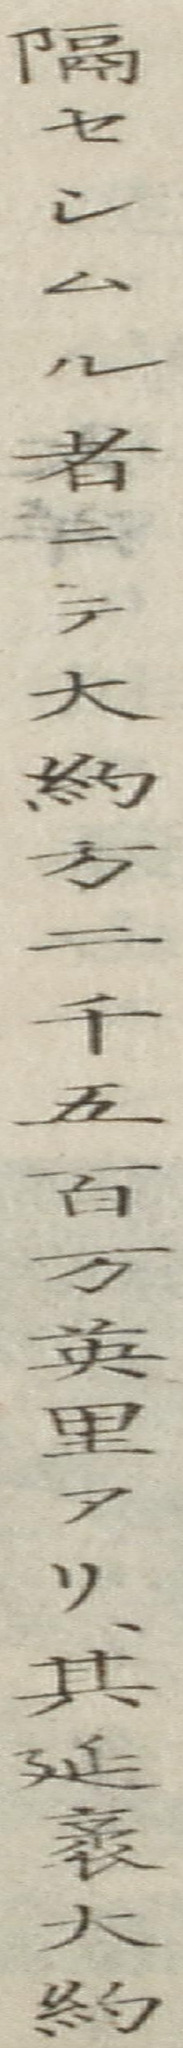隔セシムル者ニテ大約方二千五百万英里アリ、其延袤大約
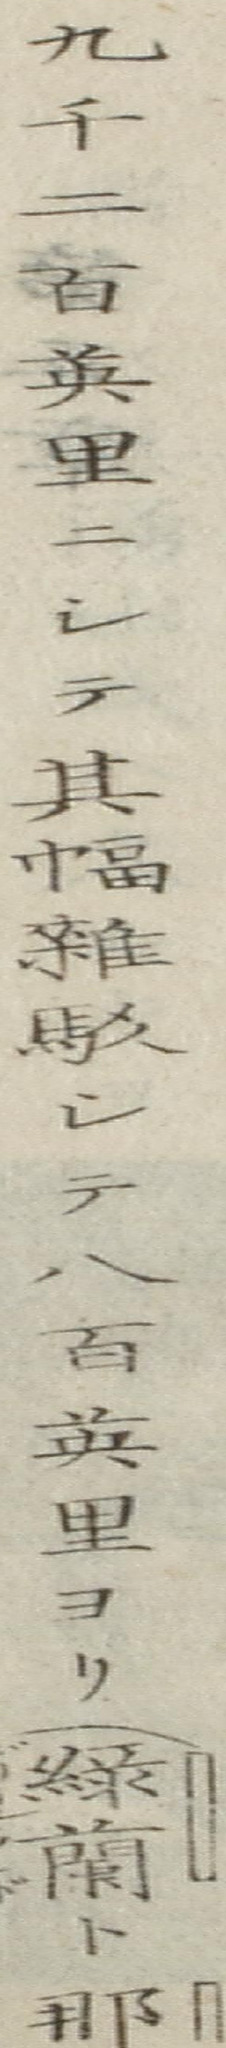九千二百英里ニシテ其幅雑駁シテ八百英里ヨリト那
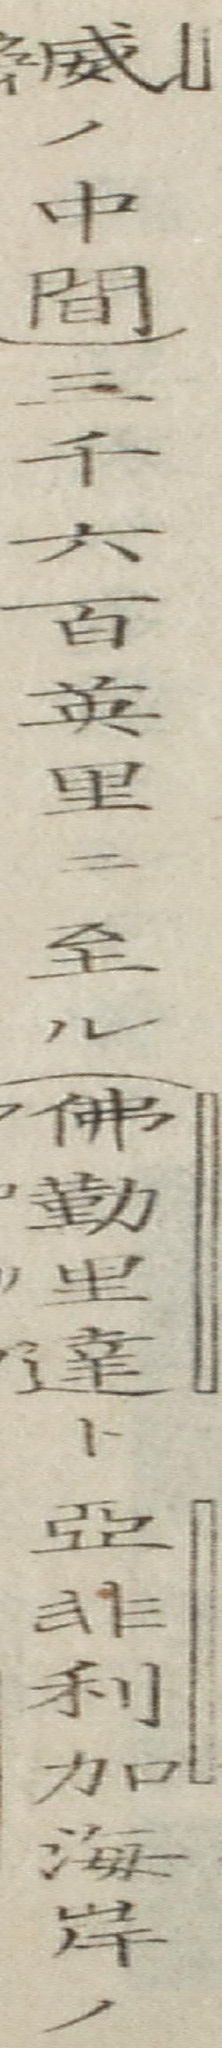威ノ中間）三千六百英里ニ至ルト亜非利加海岸ノ
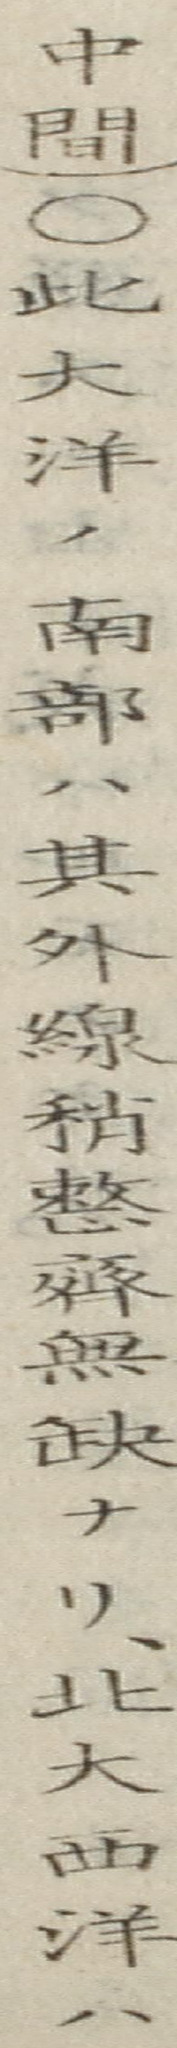中間）○此大洋ノ南部ハ其外線稍整齊無缺ナリ、北大西洋ハ
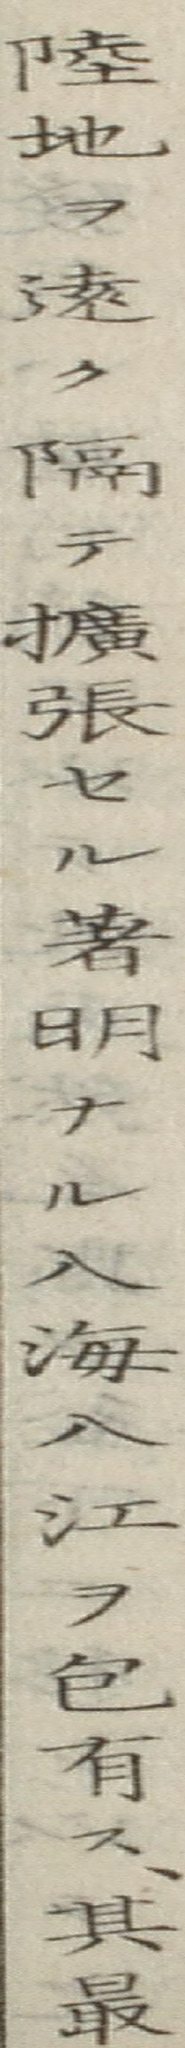陸地ヲ遠ク隔テ拡張セル著明ナル入海入江ヲ包有ス、其最
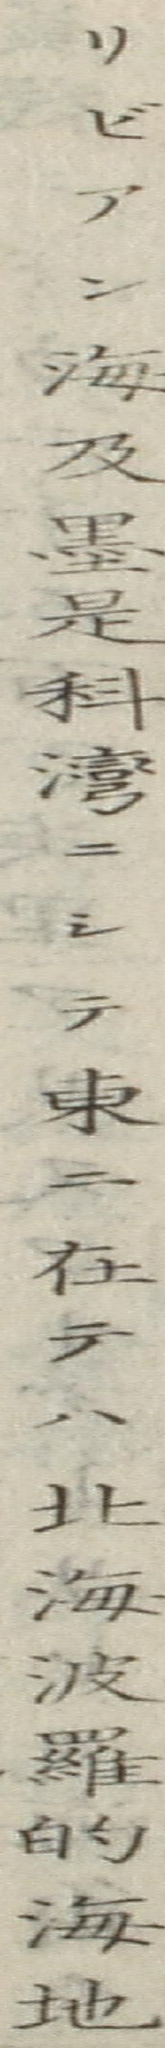リビアン海及墨是科湾ニシテ東ニ在テハ北海波羅的海地
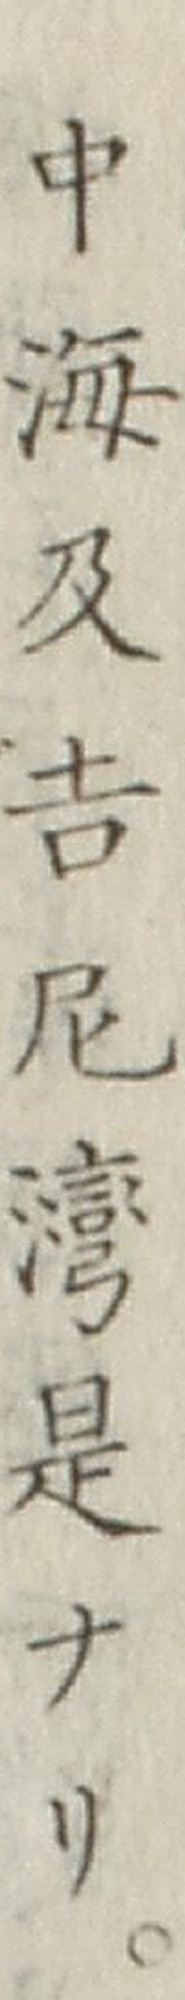中海及吉尼湾是ナリ。
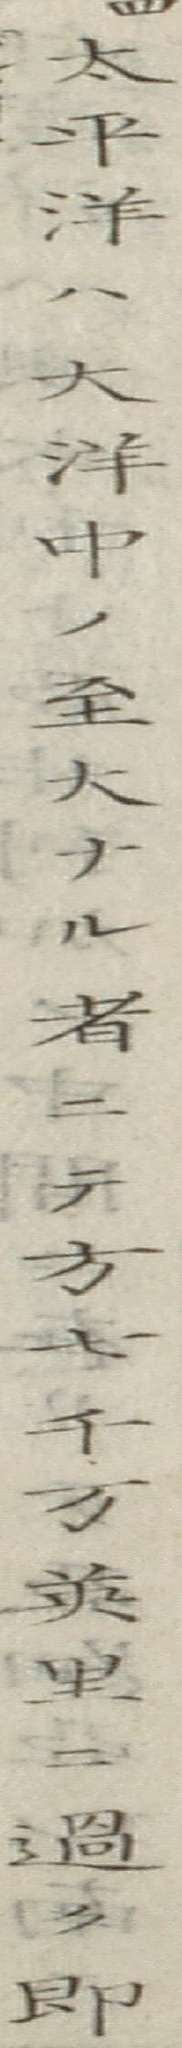四太平洋ハ大洋中ノ至大ナル者ニテ方七千万英里ニ過ク即
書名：地形論　巻二
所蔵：東京大学地震研究所図書室 Earthquake Research Institute Library, The University of Tokyo, JAPAN
